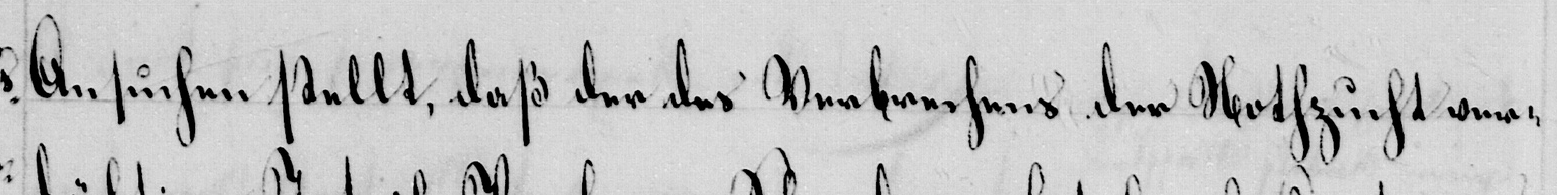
Ansuchen stellt, daß der des Verbrechens der Nothzucht ver¬
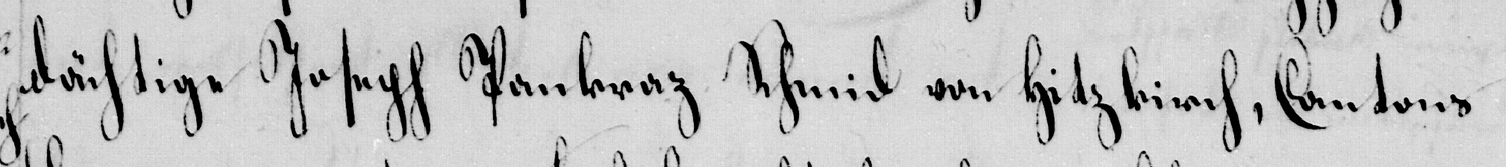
dächtige Joseph Pankraz Schmid von Hitzkirch, Cantons
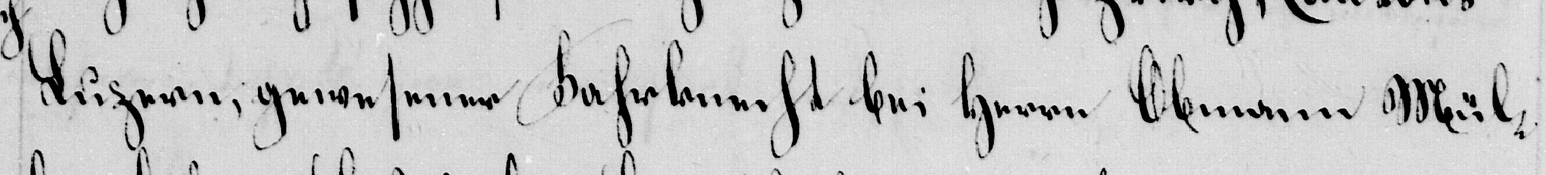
Luzern, gewesener Fahrknecht bei Herrn Obmann Mül¬
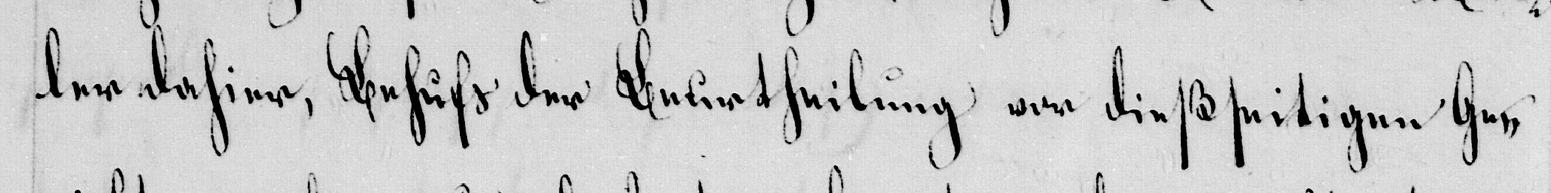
ler dahier, Behufs der Verurtheilung vor dießseitigen Ge¬
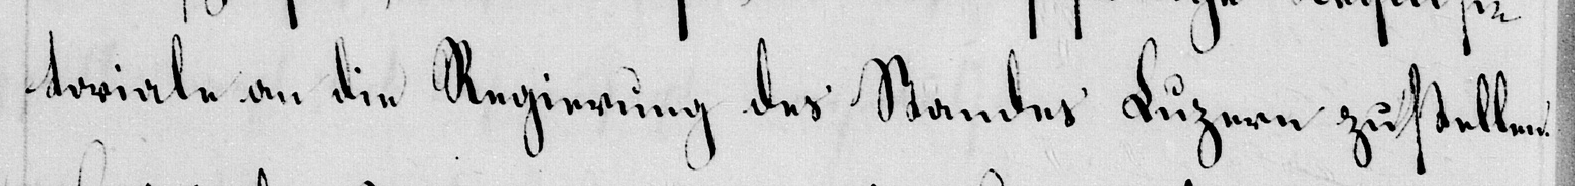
sitoriale an die Regierung des Standes Luzern zu stellen.
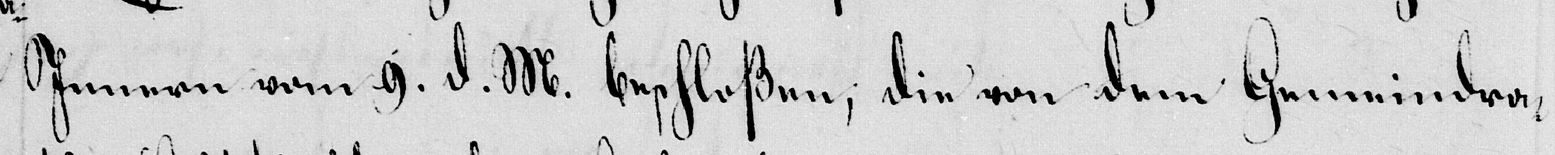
Innern vom 9. d. M. beschloßen, die von dem Gemeindra¬
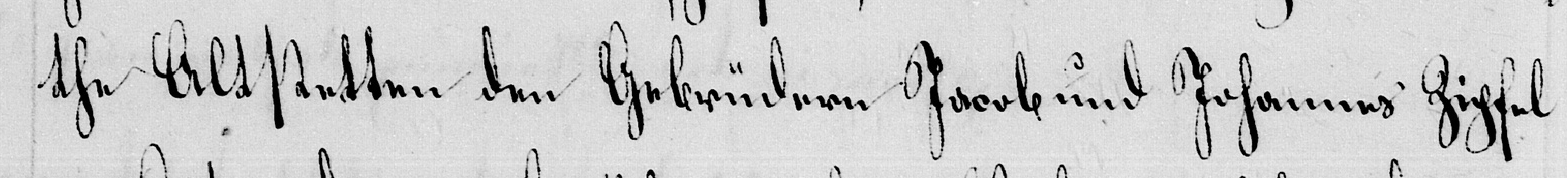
the Altstetten den Gebrüdern Jacob und Johannes Zipfel
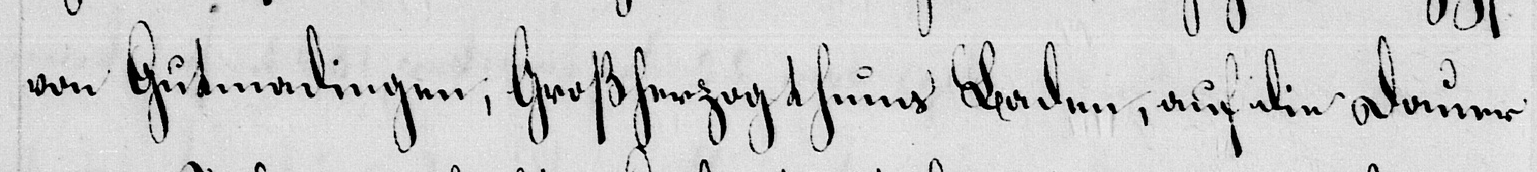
von Gutmadingen, Großherzogthums Baden, auf die Dauer
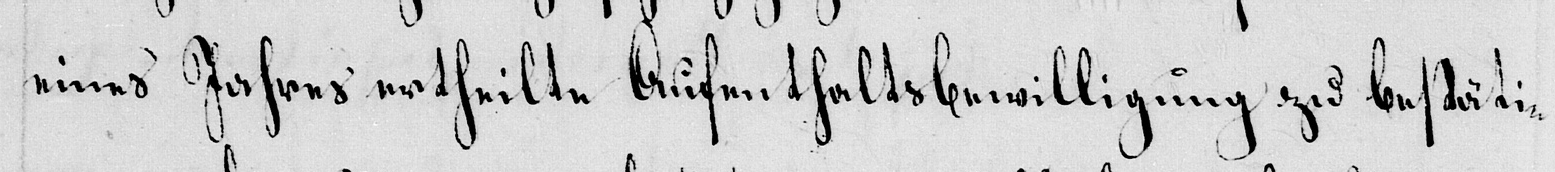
eines Jahres ertheilte Aufenthaltsbewilligung zu bestäti¬
